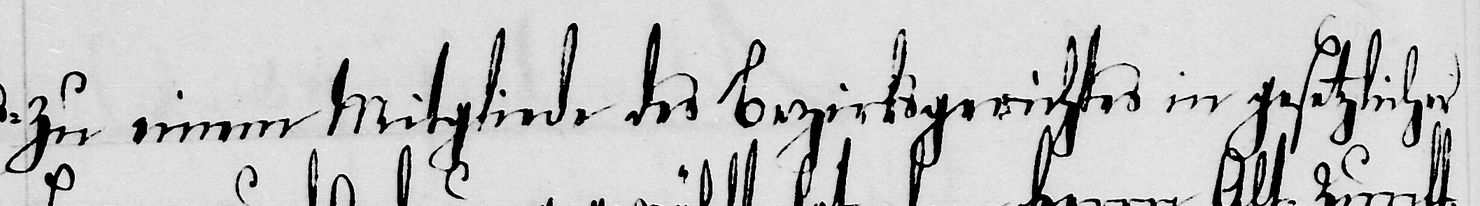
zu einem Mitgliede des Bezirksgerichtes in gesetzlic¬
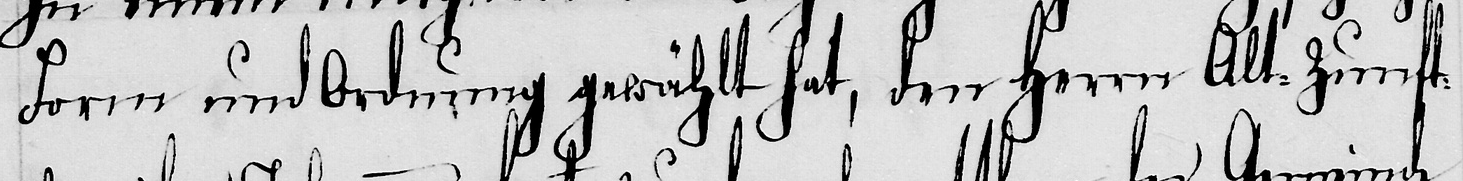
Form und Ordnung gewählt hat, den Herrn Alt-Zunft¬
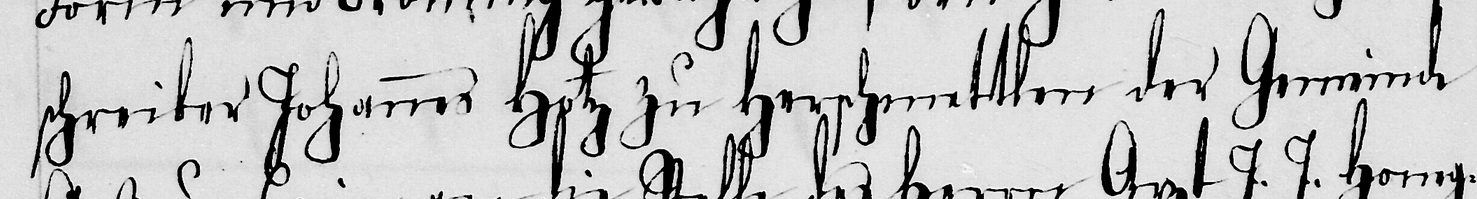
schreiber Johannes Hotz zu Herschmettlen der Gemeinde
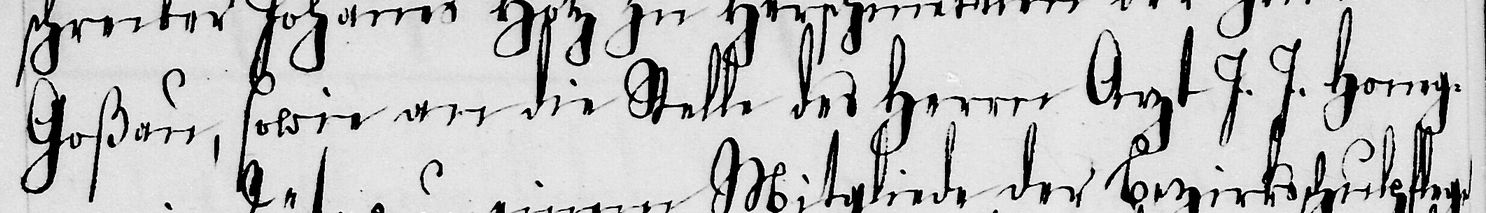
Goßau, sowie an die Stelle des Herrn Arzt J. J. Honeg¬
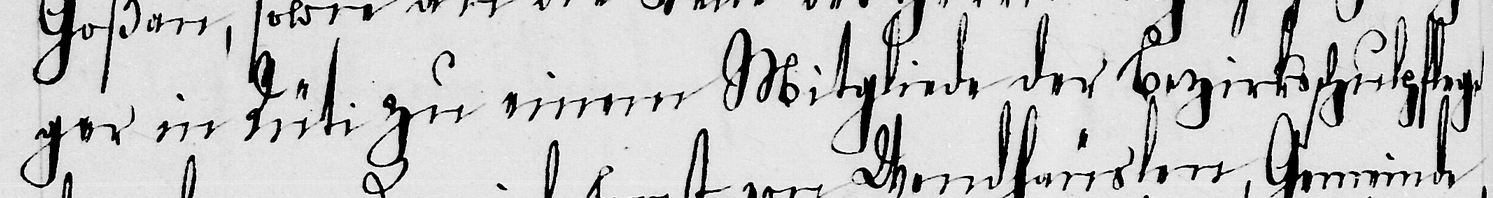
ger in Rüti zu einem Mitgliede der Bezirksschulpfle¬
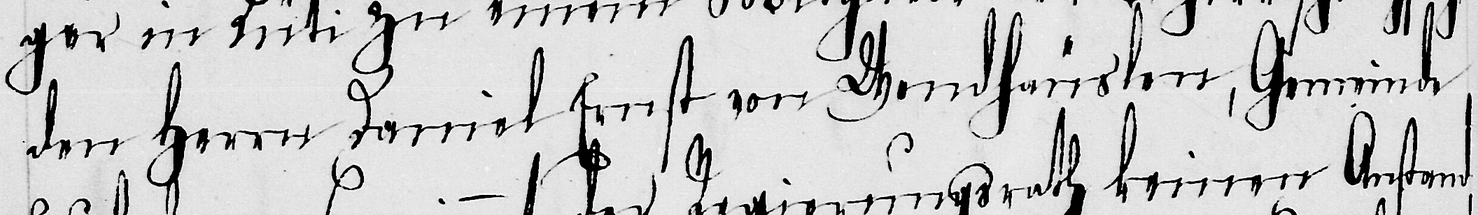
den Herrn Daniel Ernst von Wendhäuslen, Gemeinde
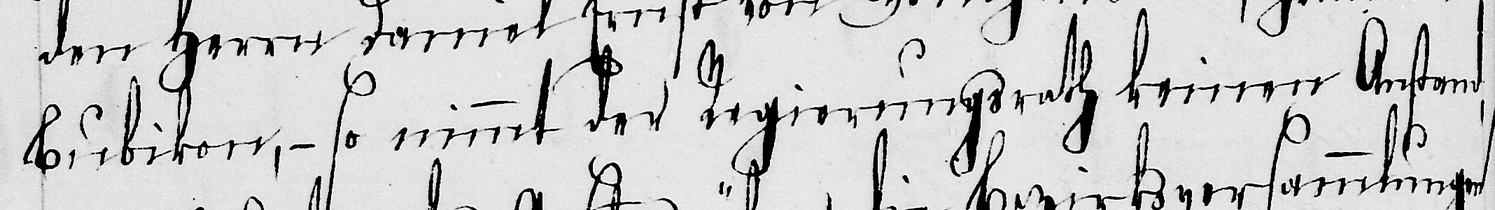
Bubikon, – so nimmt der Regierungsrath keinen Anstan¬
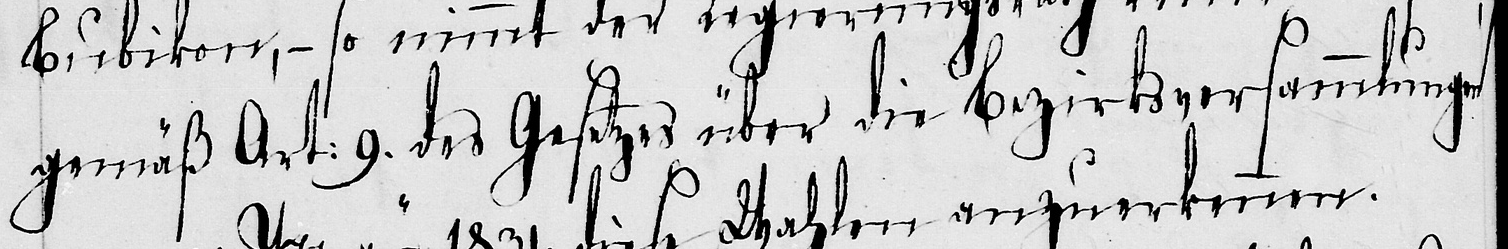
gemäß Art: 9. des Gesetzes über die Berzirksversammlungen
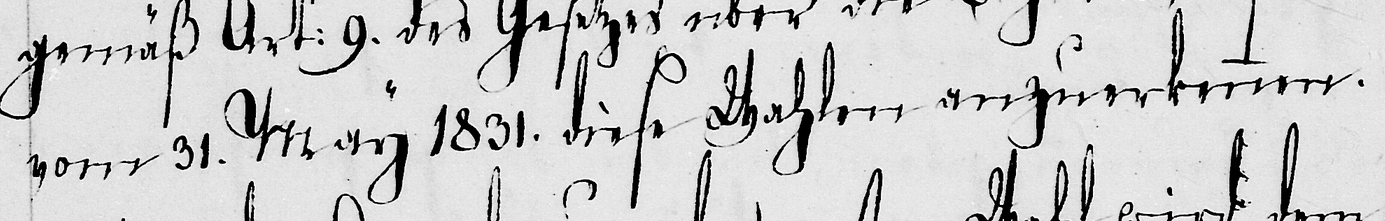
vom 31. May 1831. diese Wahlen anzuerkennen.
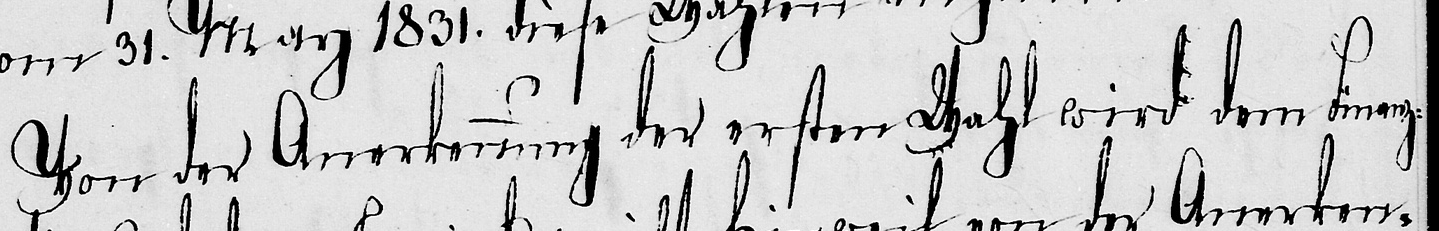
Von der Anerkennung der ersten Wahl wird dem Finan¬
